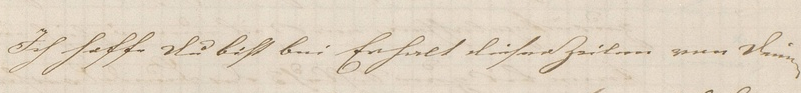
Ich hoffe Du bist bei Erhalt dieser Zeilen von Deinen
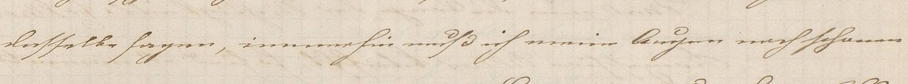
dasselbe sagen, immerhin muß ich meine Augen noch schonen
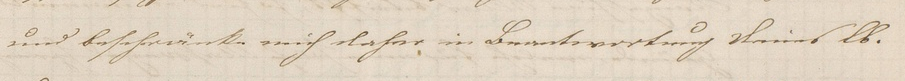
und beschränke mich daher in Beantwortung Deines lb.
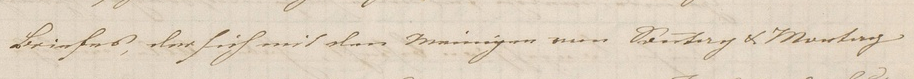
Briefes, der sich mit den Meinigen von Sonntag & Montag
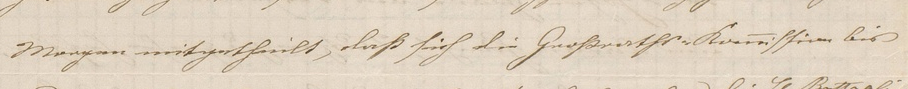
Morgen mitgetheilt, daß sich die Großraths-Kommission bis
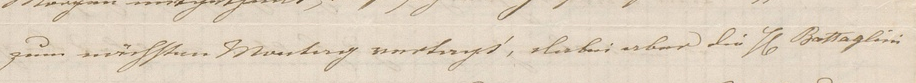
zum nächsten Montag vertagt, dabei aber die Herrn Battaglini
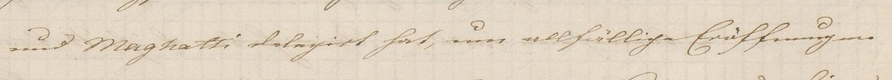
und Maghatti delegirt hat, um allfällige Eröffnungen
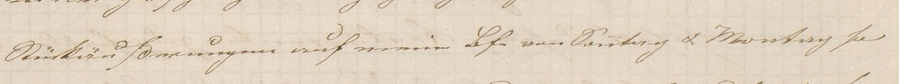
Rückäußerungen auf meine Bfe. von Sonntag & Montag so
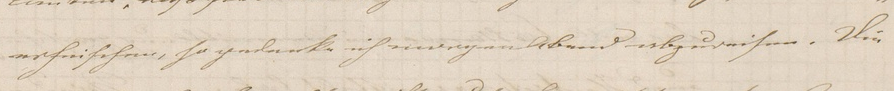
erheischen, so gedenke ich morgen Abend abzureisen. Die
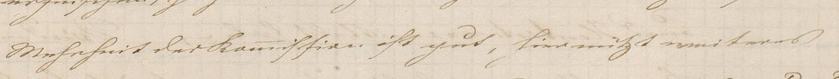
Mehrheit der Kommission ist gut, hier nützt weiteres
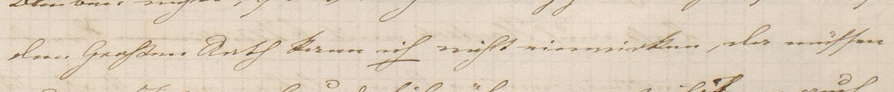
den Großen Rath kann ich nicht einwirken, da müssen
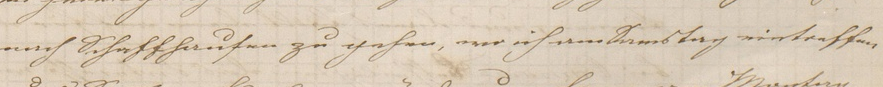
nach Schaffhausen zu gehen, wo ich am Samstag eintreffen
